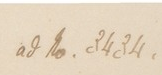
Nationalrath Dr.
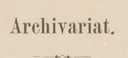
Archivariat.
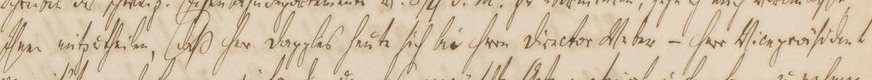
Ihnen mitzutheilen, daß Herr Dapplesheute sich bei Herrn Director Weber – Herr Vicepräsident
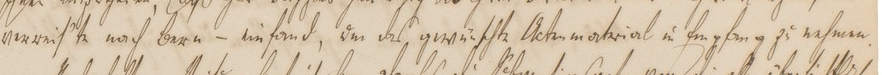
verreiste nach Bern – einfand, um das gewünschte Actenmaterial in Empfang zu nehmen.
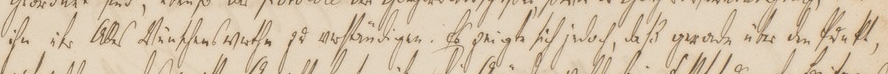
ihn über Alles Wünschenswerthe zu verständigen. Es zeigte sich jedoch, daß gerade über den Punkt,
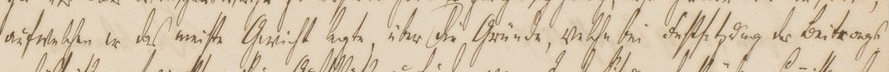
auf welchen er das meiste Gewicht legte, über die Gründe, welche bei Festsetzung des Beitrags-
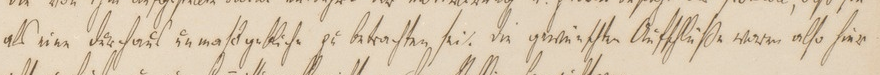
als eine durchaus unmaßgebliche zu betrachten sei. Die gewünschten Aufschlüße waren also hier
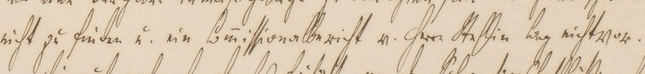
nicht zu finden u. ein Commissionalbericht v. Herrn Stehlin lag nicht vor.
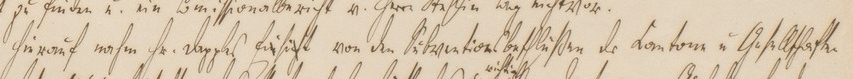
Hierauf nahm Hr. DapplesEinsicht von den Subventionsbeschlüßen dr Kantone u
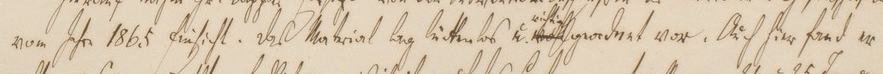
vom Jahre 1865 Einsicht. Das Material lag lückenlos u. wohlrichtig geordnet vor. Auch hier
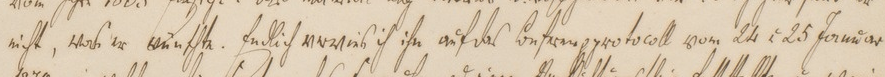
nicht, was er wünschte. Endlich verwies ich ihn auf das Conferenzprotocoll vom 24 u 25 Januar
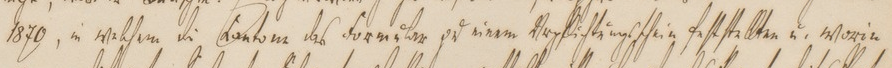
1870, in welchem die Kantone das Formular zu einem Verpflichtungsschein feststellten u. worin
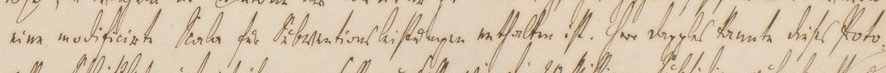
eine modificirte Scala für Subventionsleistungen enthalten ist. Herr Dapples kannte dieses
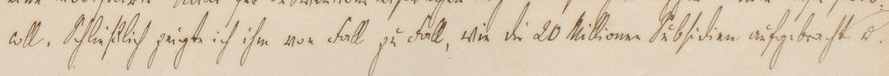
Schließlich zeigte ich ihm von Fall zu Fall, wie die 20 Millionen Subsidien aufgebracht
